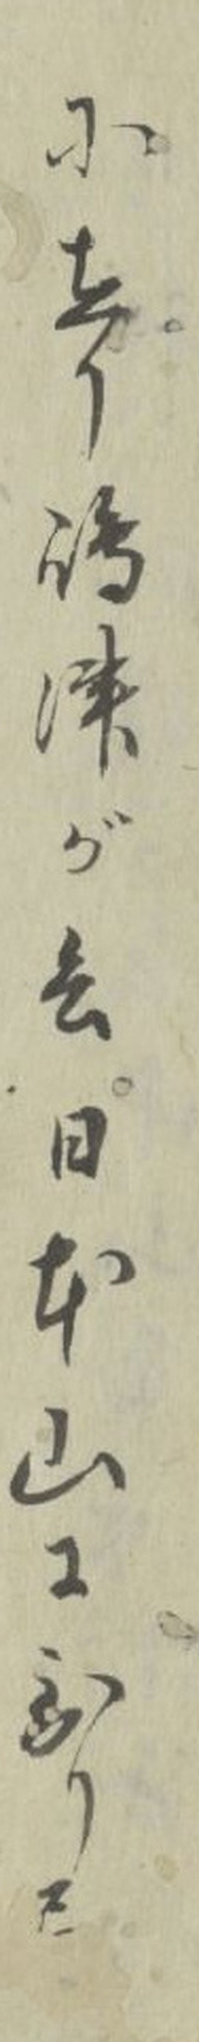に在り島津が兵日本山に至り弓
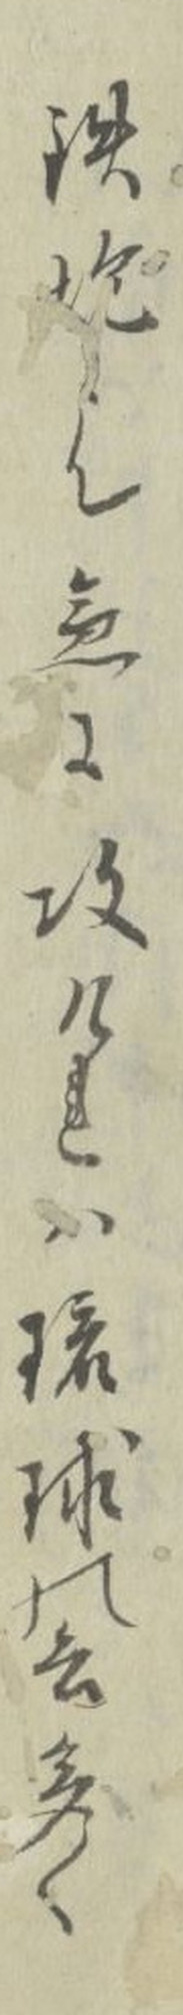鉄炮にて急に攻けれは琉球の兵多く
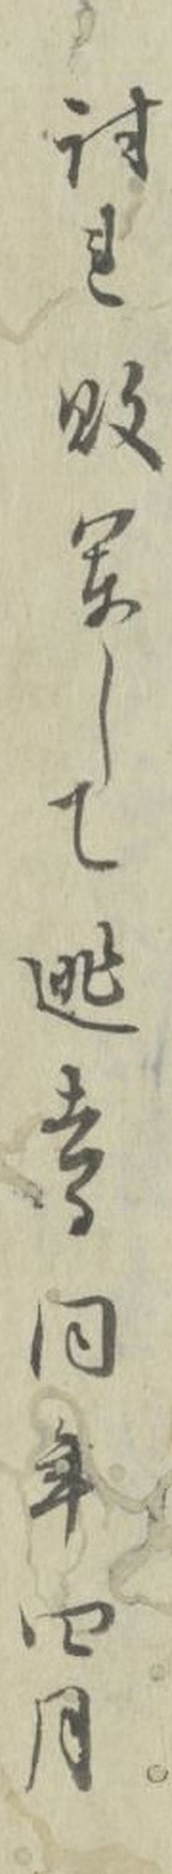討れ敗軍して逃去る同年四月
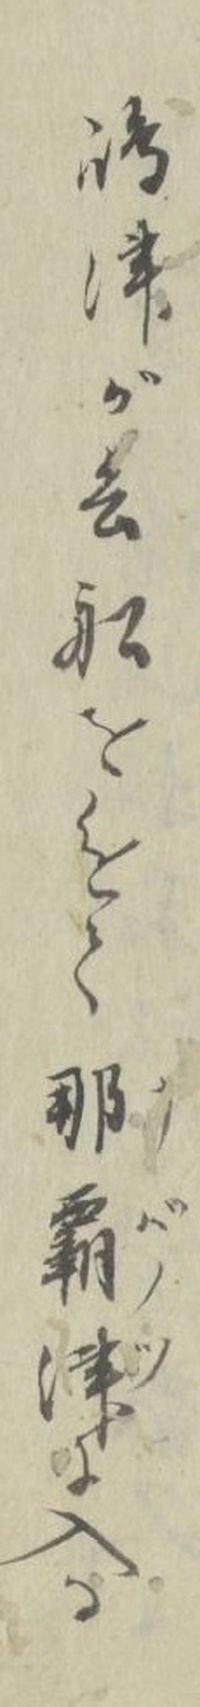島津が兵船を進て那覇津に入る
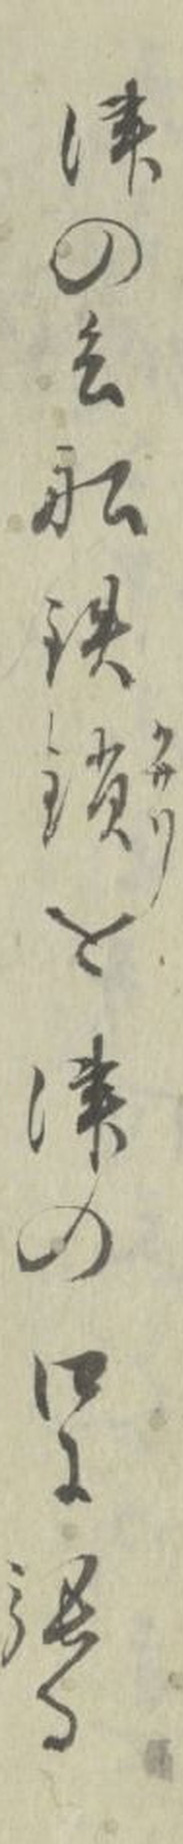津の兵船鉄鎖を津の口に張る
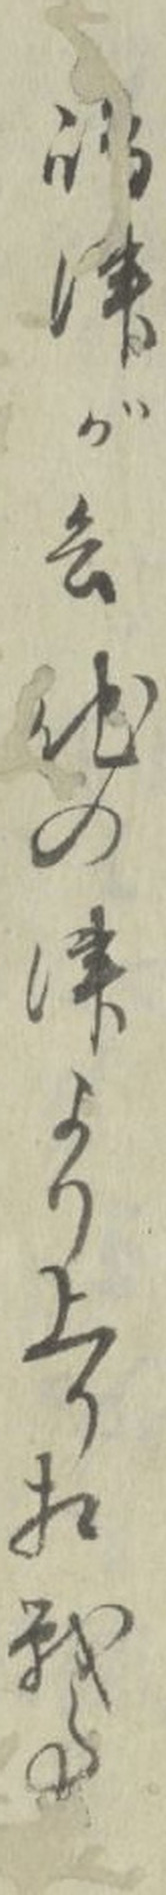島津が兵他の津より上り相戦事

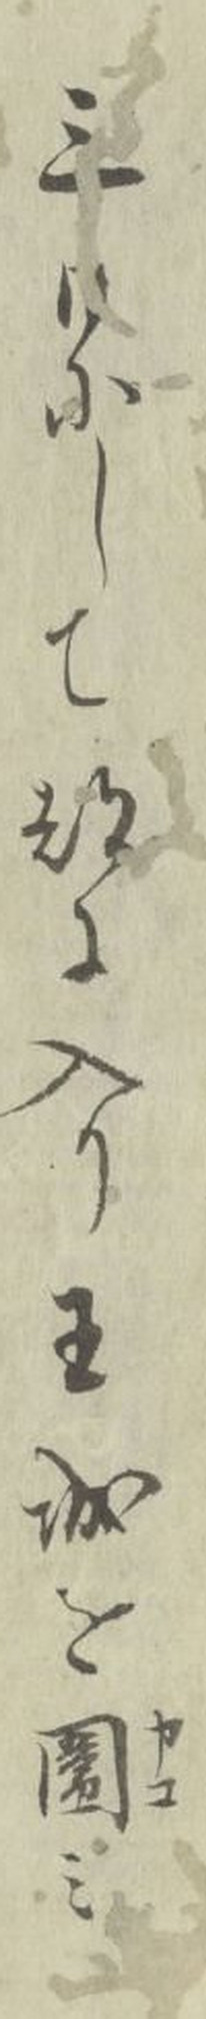三日にして都に入り王城を圍み
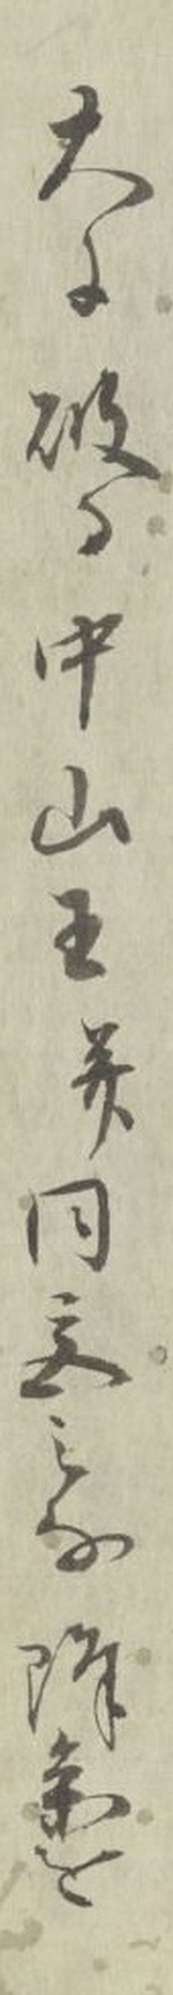大に破る中山王幷同宮みな降参を
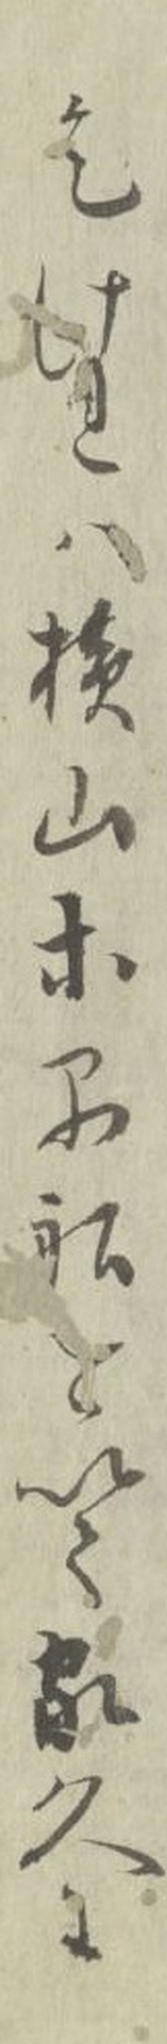乞けれは横山等早船を以て家久に
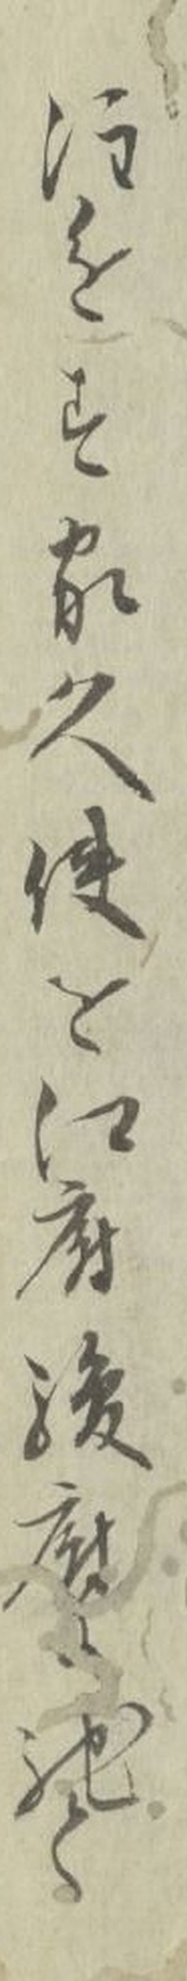注進す家久使を江府駿府に馳て
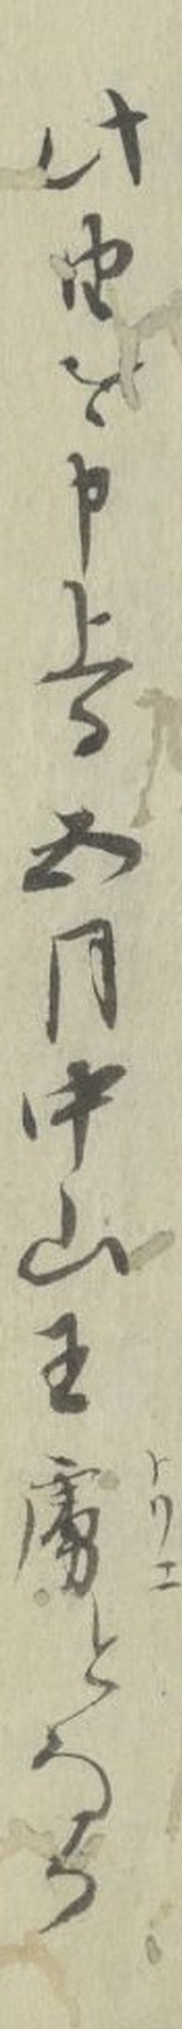此由を申上る五月中山王虜となり
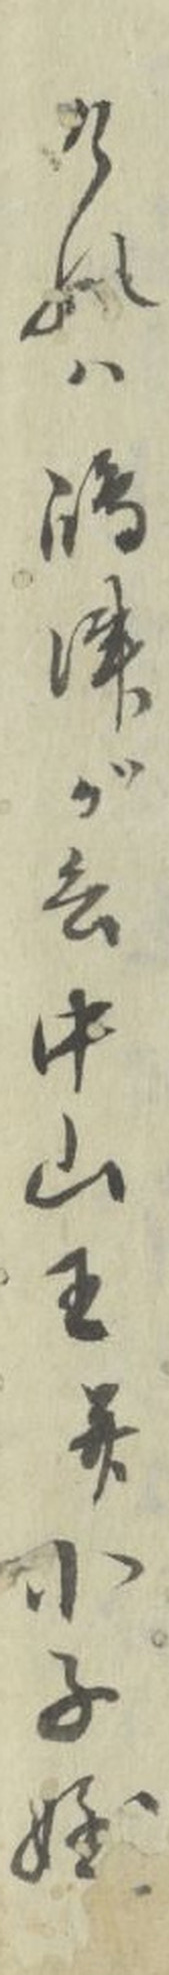けれは島津が兵中山王幷小子姪
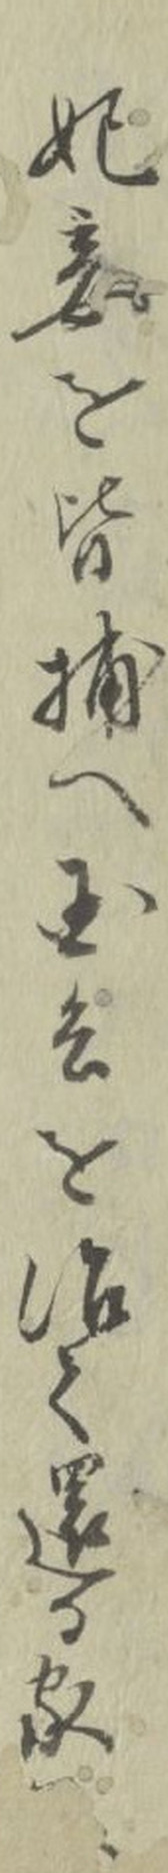妃妾を皆捕へ国兵を治て還る家久
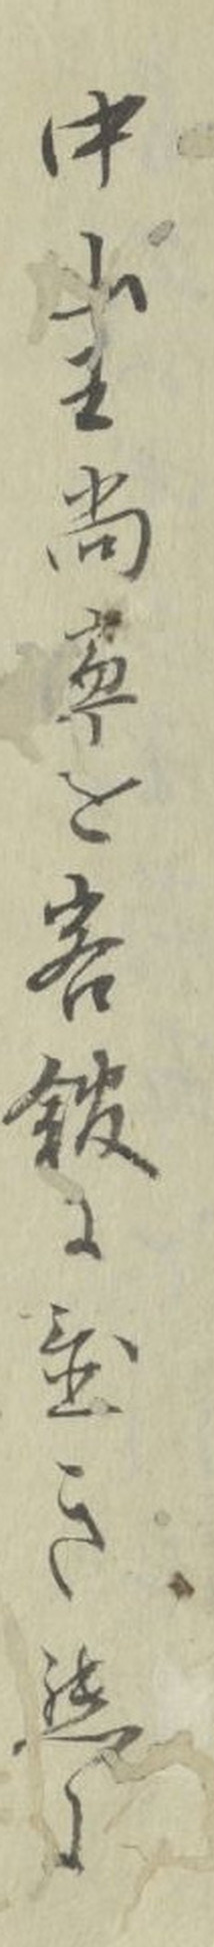中山王尚寧を客館に置き然に
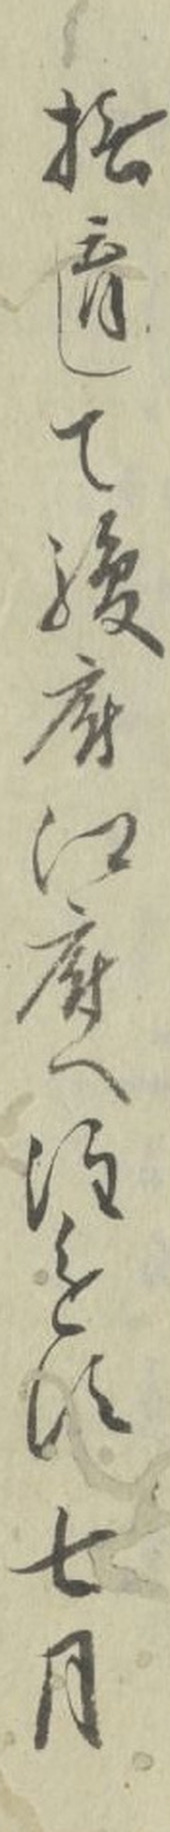撫育して駿府江府へ注進す七月
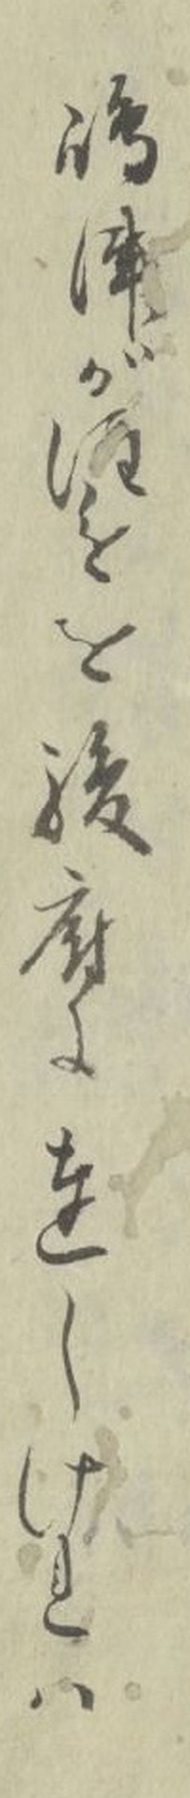島津が注進を駿府に達しけれは
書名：琉球来朝記 自一至七
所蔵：University of the Ryukyus Library
